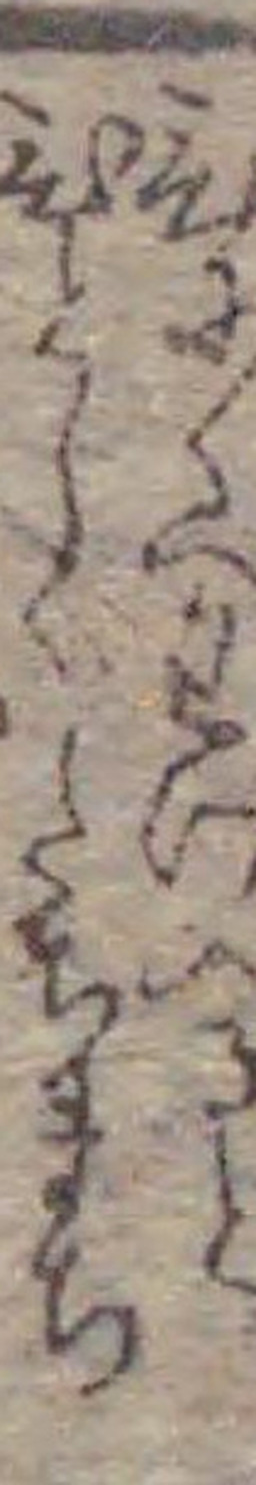ひとしくたちまち
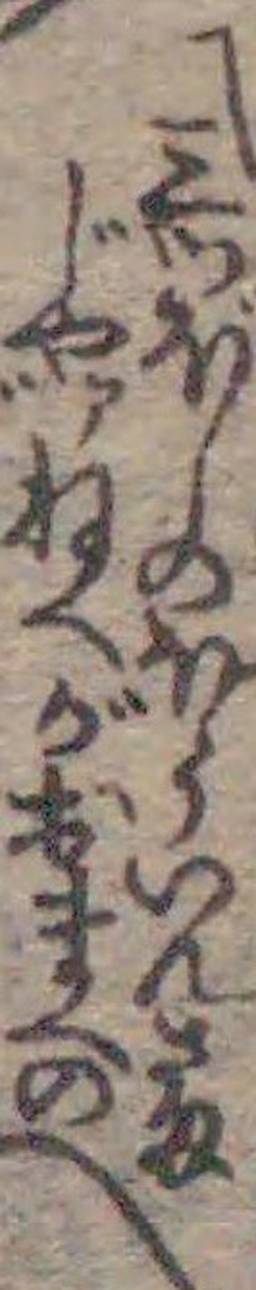じやァねへがおまへの
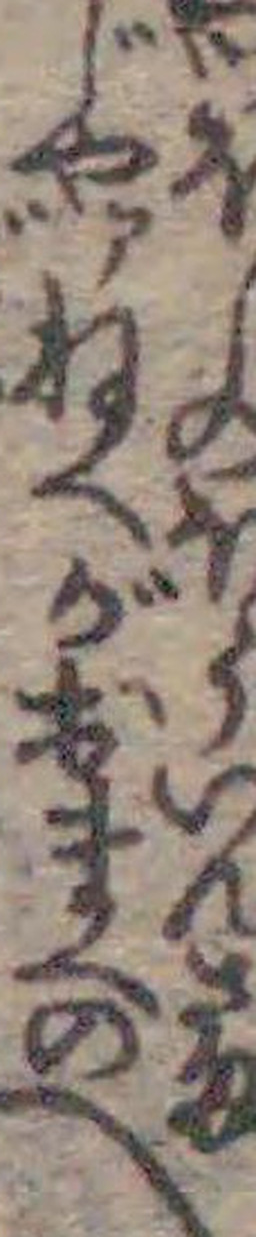じやァねへがおまへの
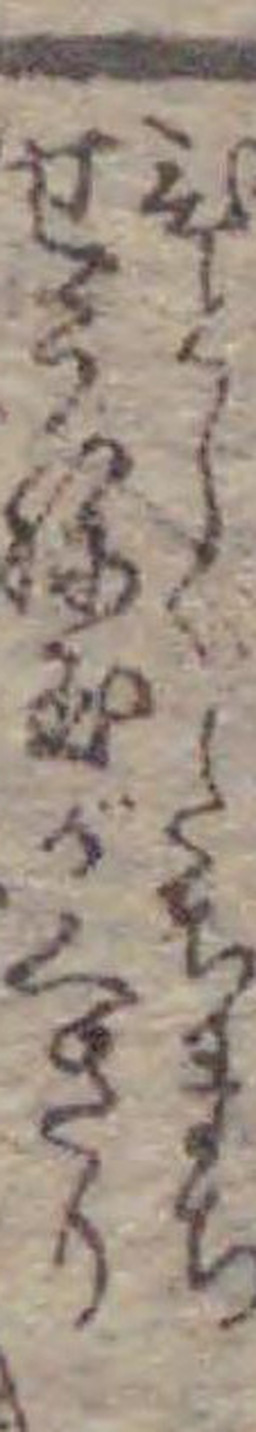せうね玉がくさり
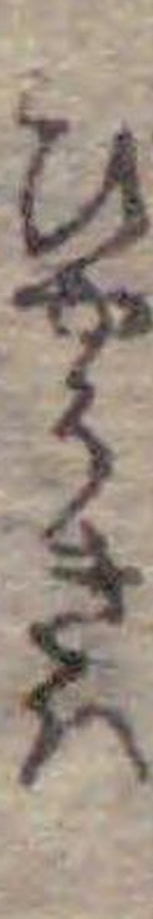びやうきは
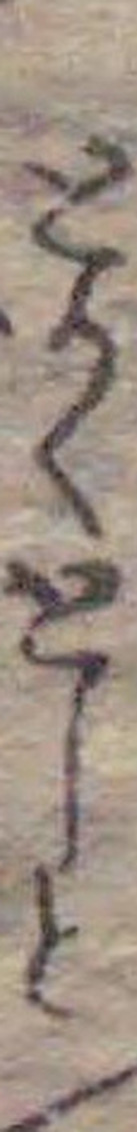とかくとしと
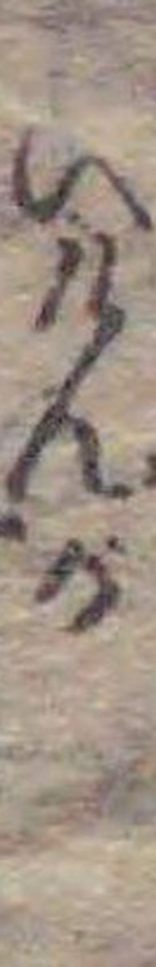いけんが
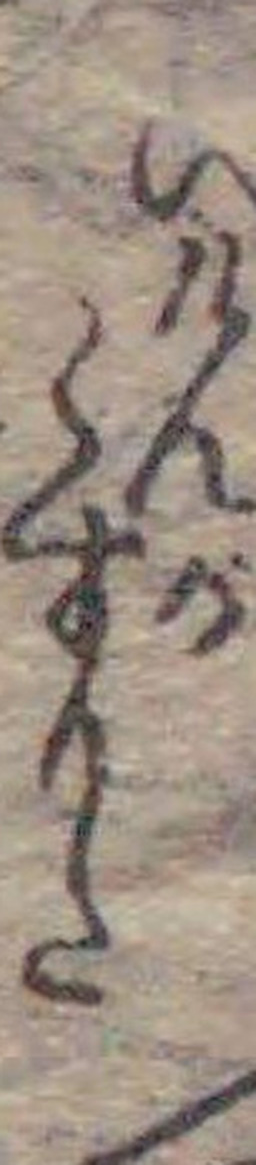くすりた
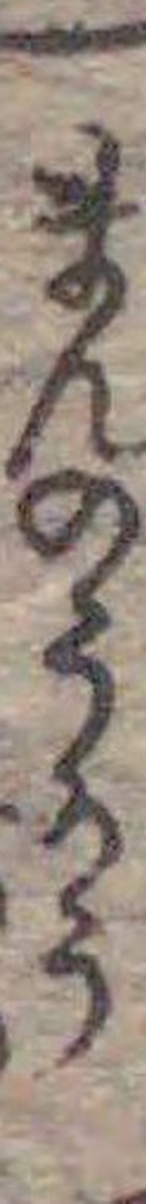まんのうかう
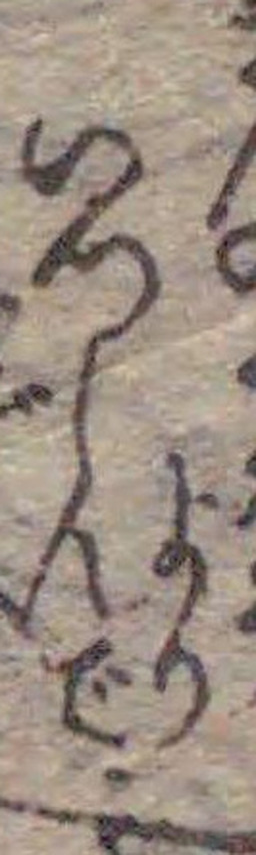いつしんで
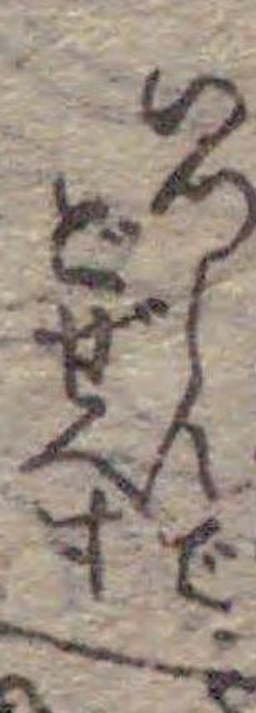ごぜへす
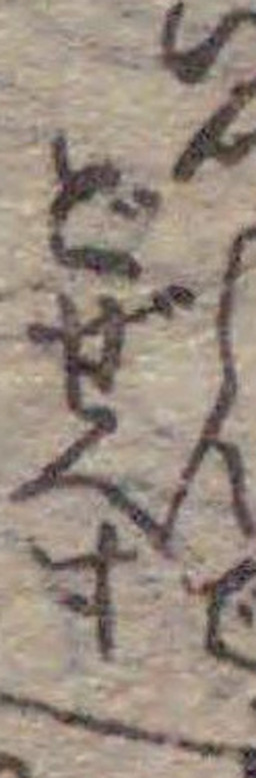ごぜへす
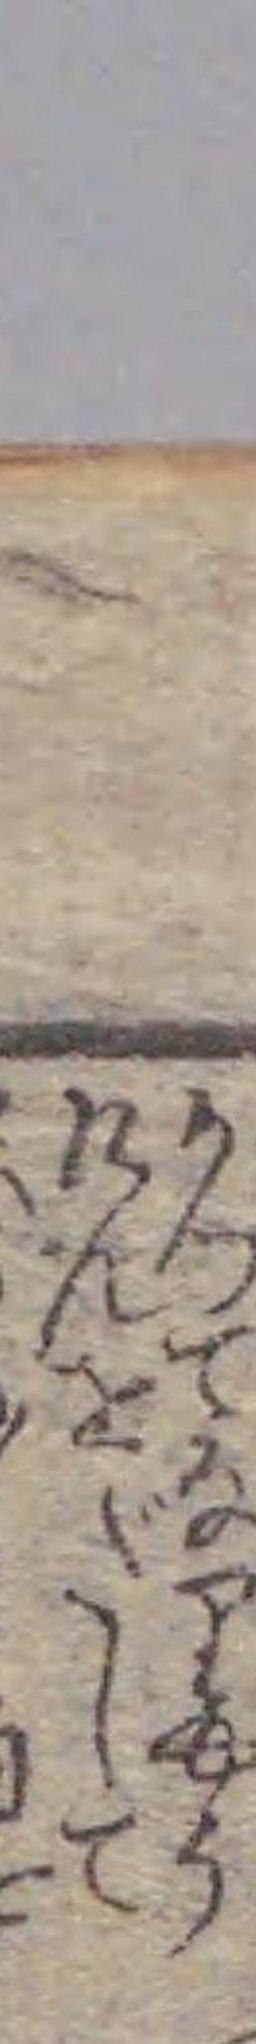けんをだして
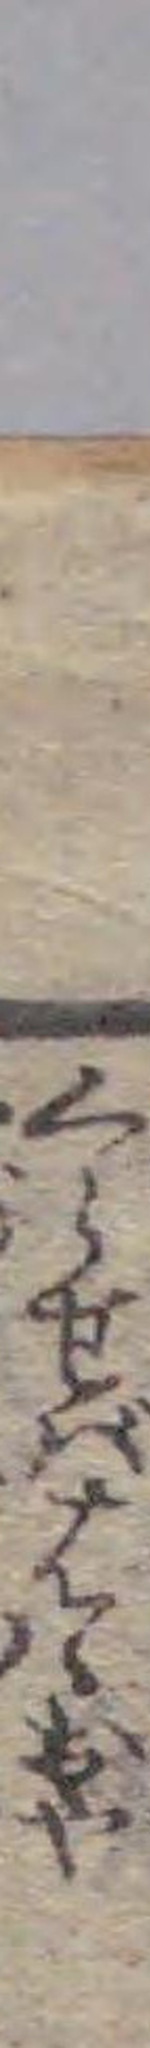くらせばはゝおや
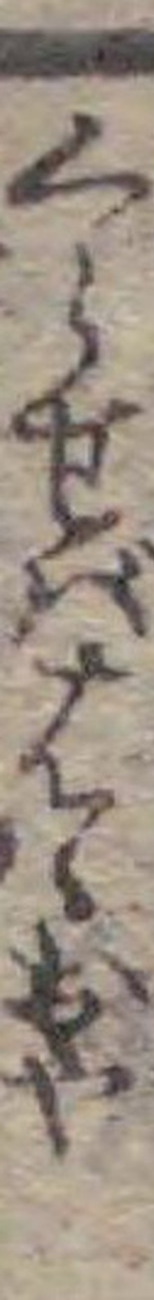くらせばはゝおや
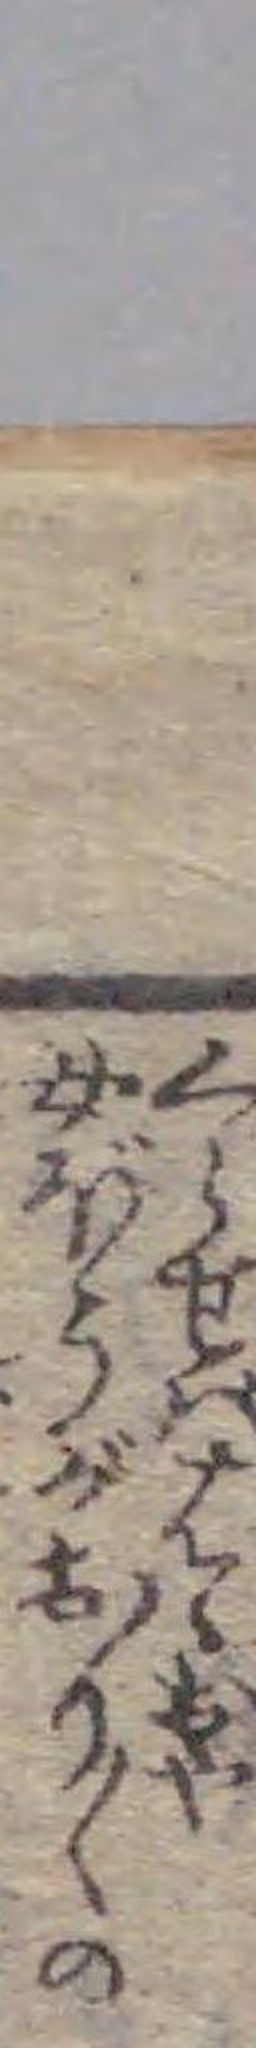女ぼうがおり〳〵の
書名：四遍搨心学草帋 : 3巻
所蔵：国立国会図書館 National Diet Library, JAPAN
